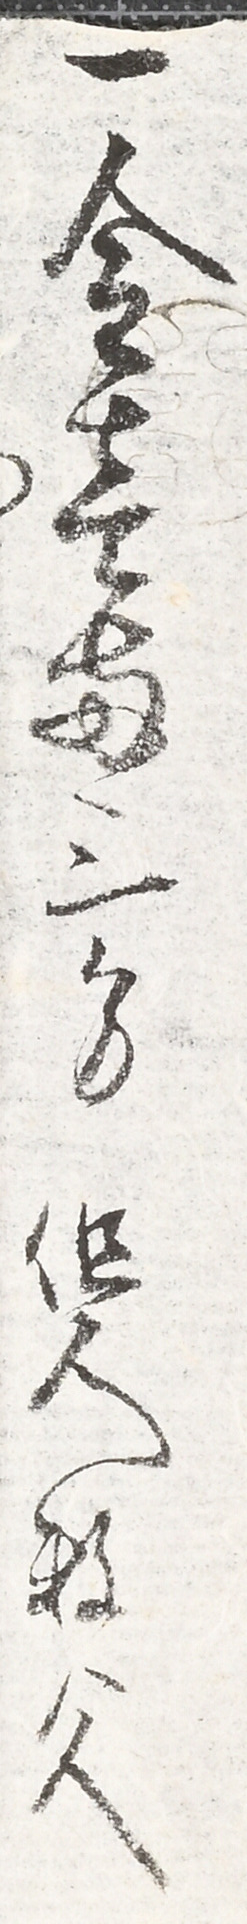一金壱両三分但人数八人
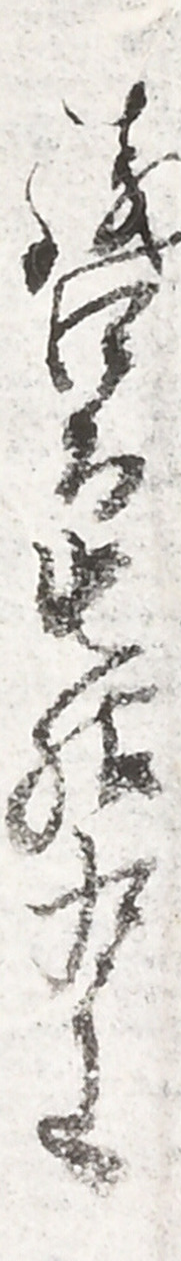銭四百七拾九文
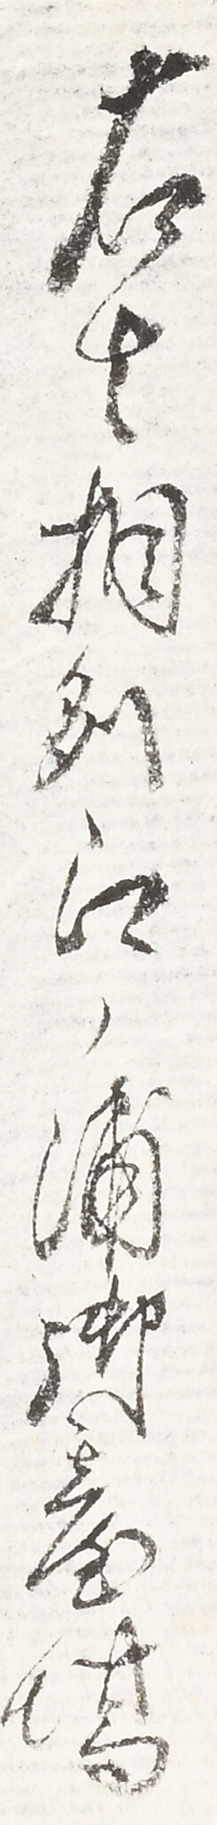右者相州江ノ浦御台場
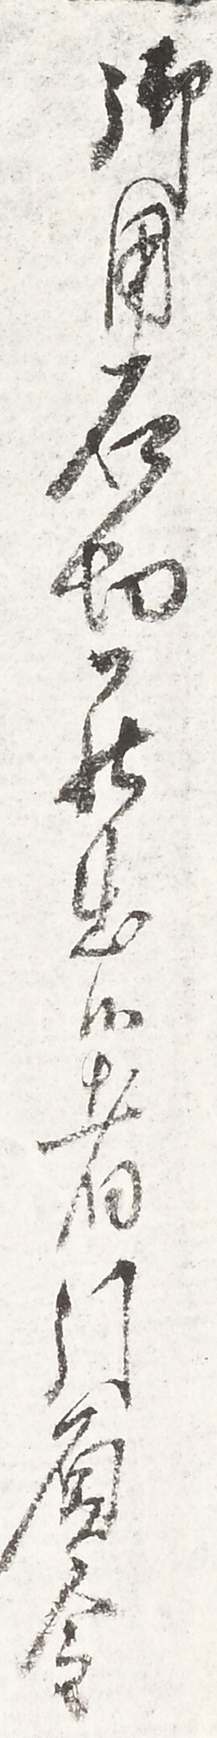御用石切罷出候者引負金
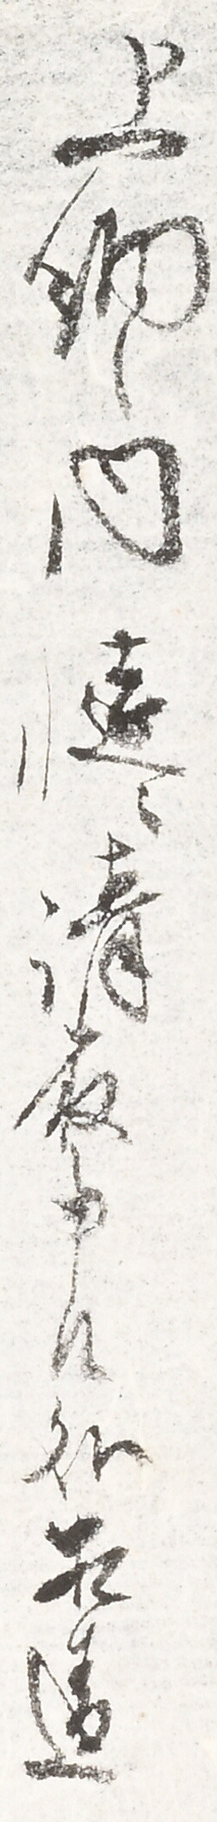上納之内慥ニ請取申候処相違
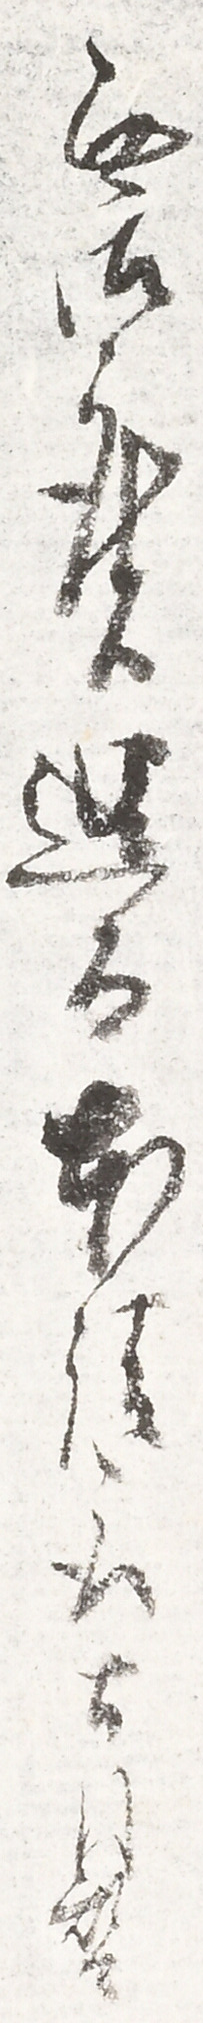無御座候追而本請取候引替
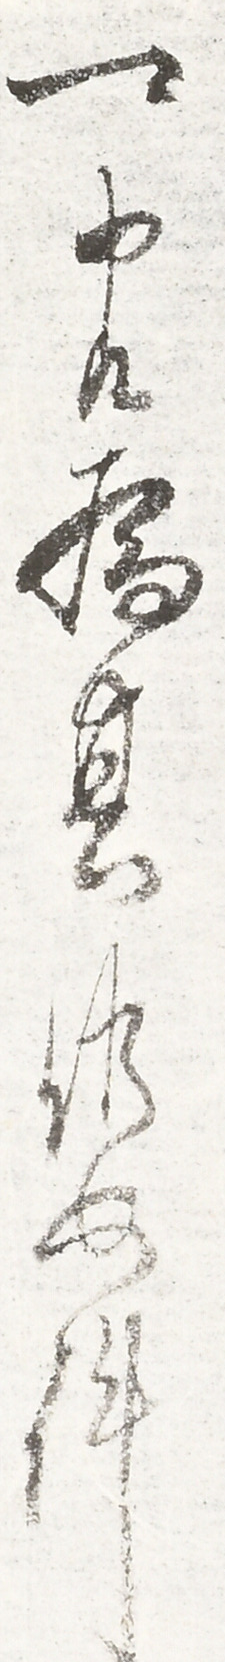可申候為其仍如件
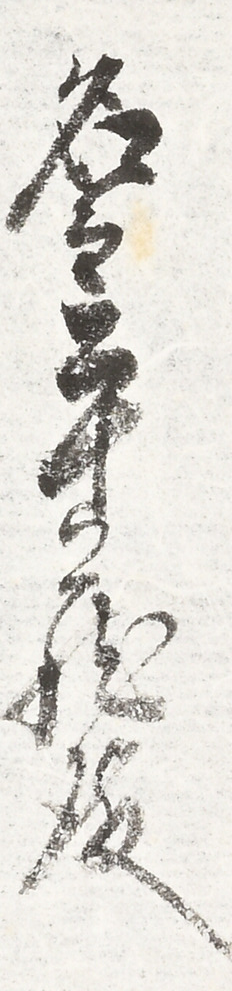名主平蔵殿
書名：覚
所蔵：伊那市立高遠町図書館・合同会社AMANE
